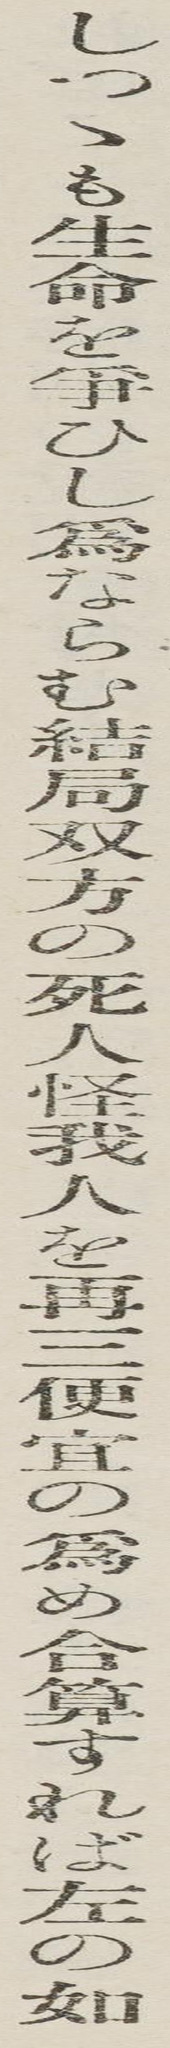しつゝも生命を争ひし為ならむ結局双方の死人怪我人を再三便宜の為め合算すれば左の如
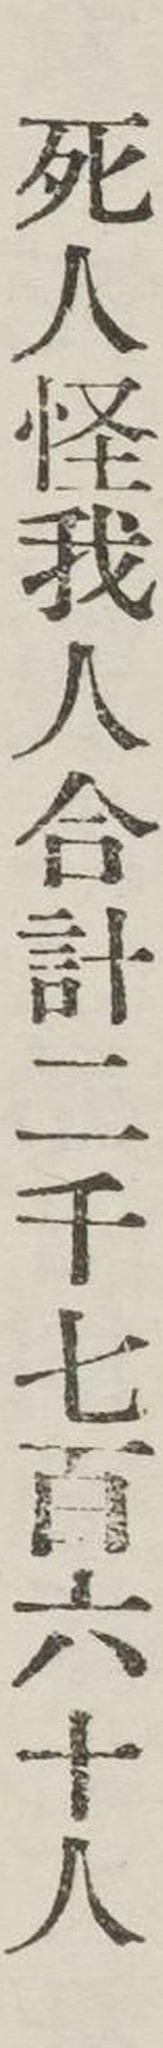死人怪我人合計二千七百六十人

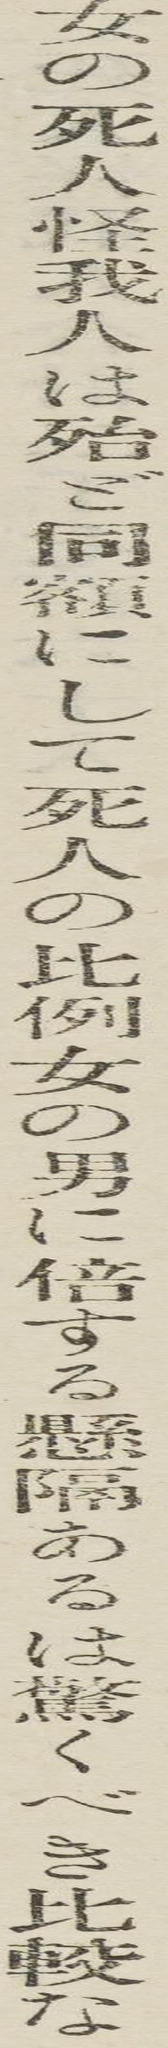男女の死人怪我人は殆ど同額にして死人の比例女の男に倍する懸隔あるは驚くべき比較な
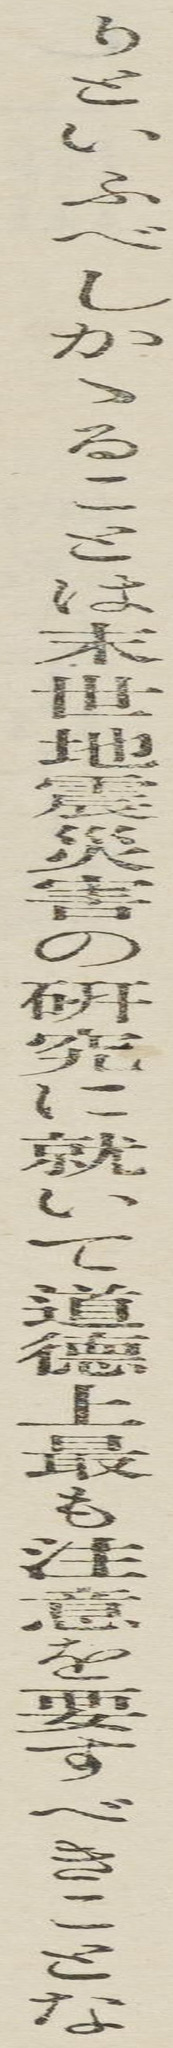りといふべしかゝることは末世地震災害の研究に就いて道徳上最も注意を要すべきことな
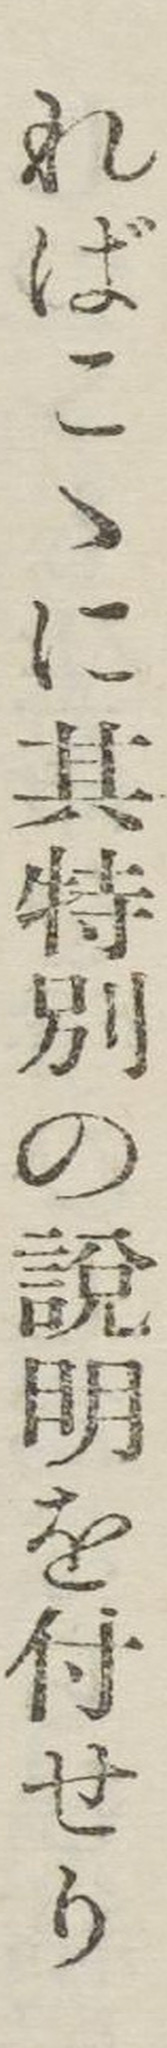ればこゝに其特別の説明を付せり
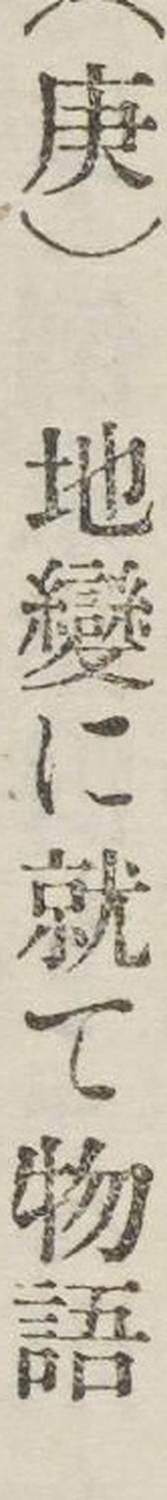地変に就て物語
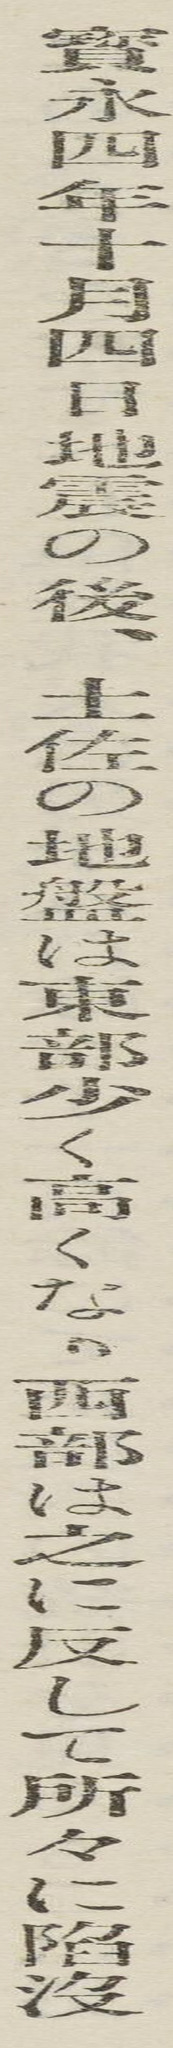宝永四年十月四日地震の後、土佐の地盤は東部少し高くなり西部は之に反して所々に陥没
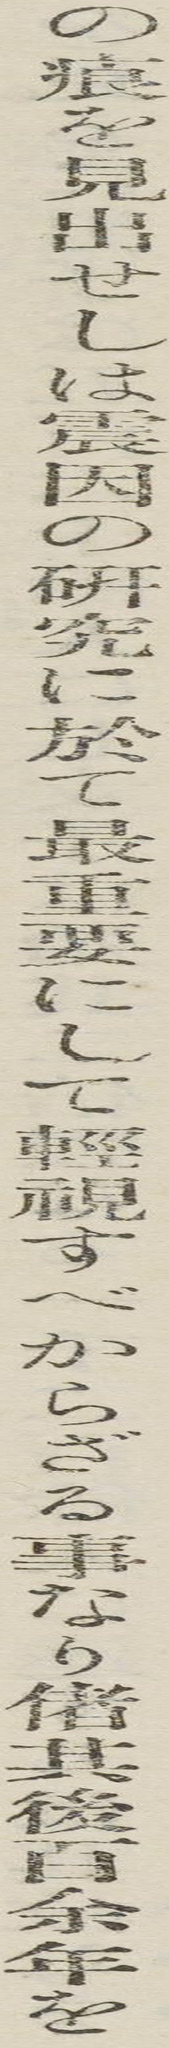の痕を見出せしは震因の研究に於て最重要にして軽視すべからざる事なり偖其後百余年を
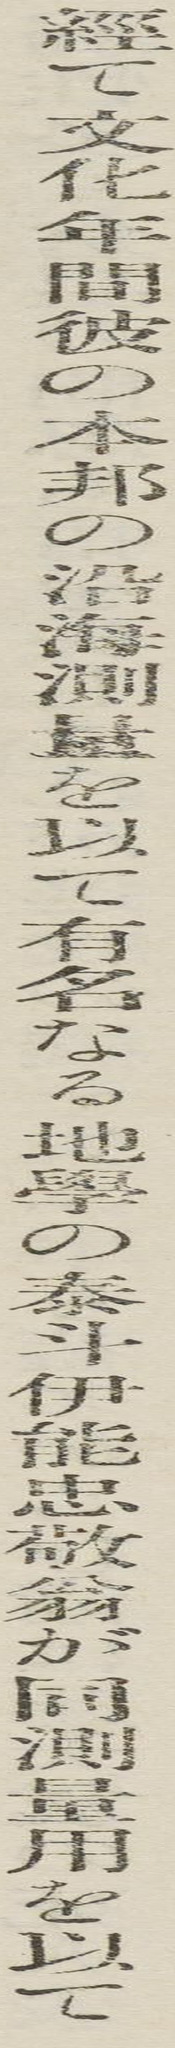経て文化年間彼の本邦の沿海測量を以て有名なる地学の泰斗伊能忠敬翁が同測量用を以て
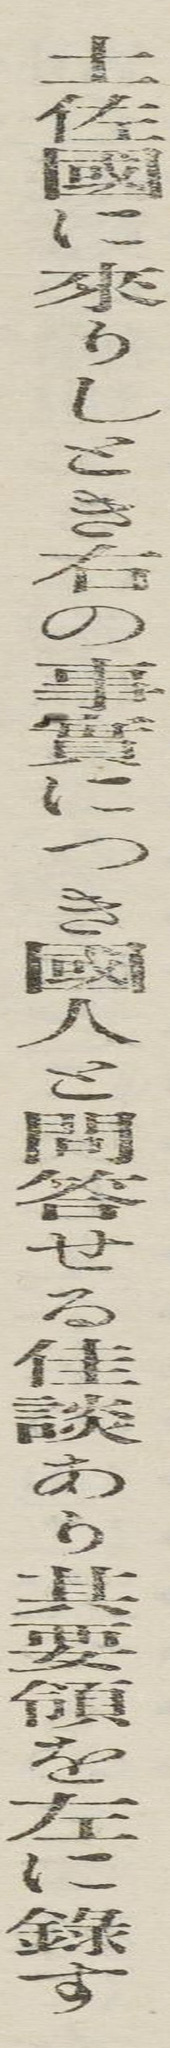土佐国に来りしとき右の事実につき国人と問答せる佳談あり其要領を左に録す
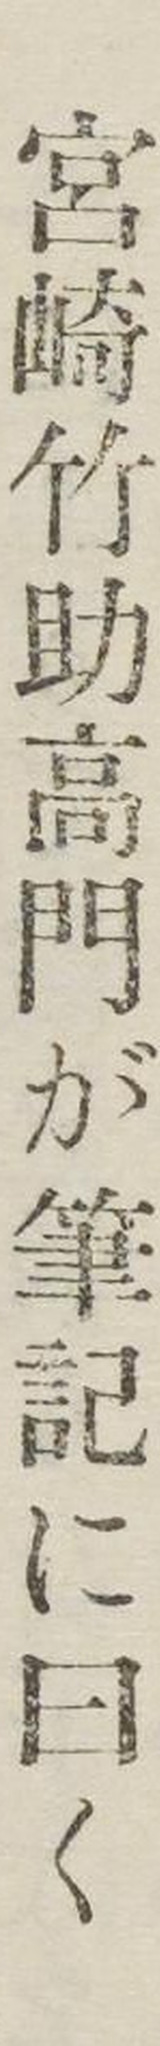宮崎竹助高門が筆記に曰く
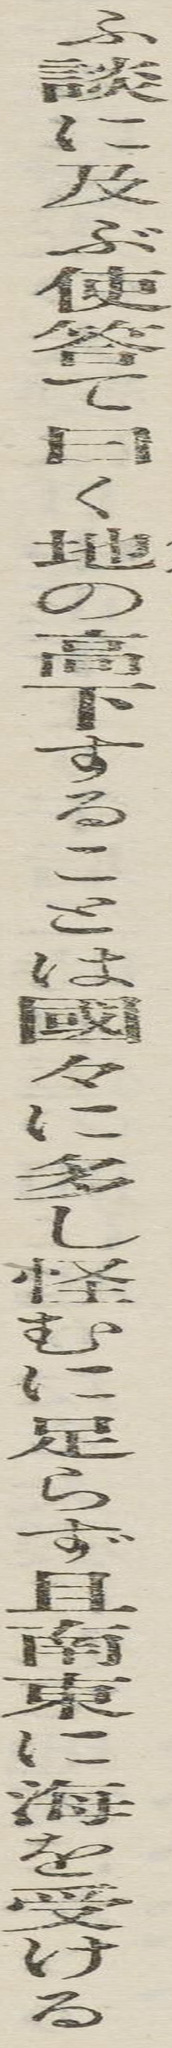ふ談に及ぶ使答て曰く地の高下することは国々に多し怪しむに足らず且南東に海を受ける
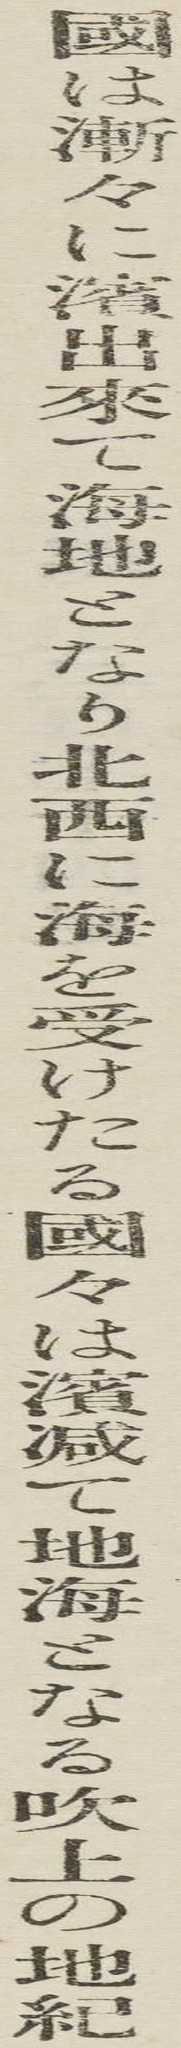国は漸々に浜出来て海地となり北西に海を受けたる国々は浜減て地海となる吹上の地紀
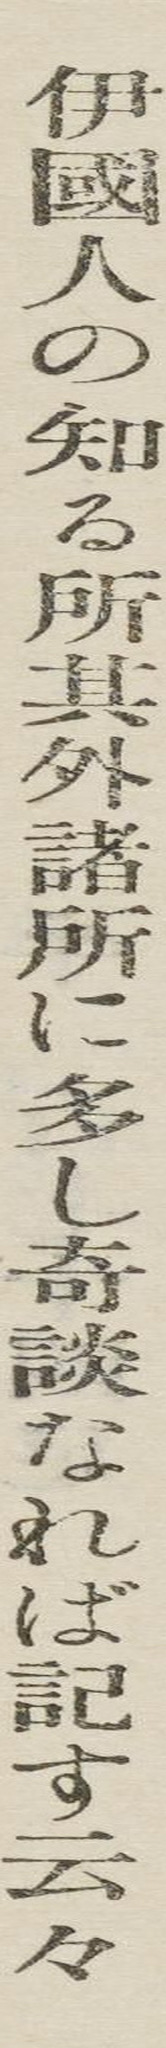伊国人の知る所其外諸所に多し奇談なれば記す云々
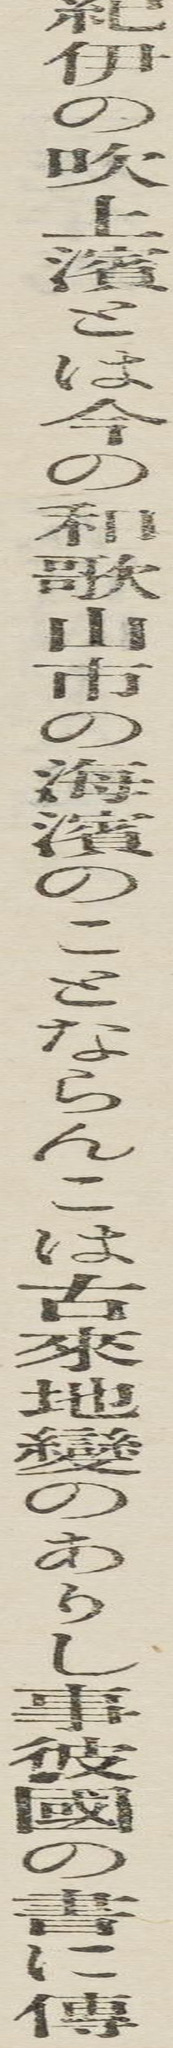紀伊の吹上浜とは今の和歌山市の海浜のことならんこは古来地変のありし事彼国の書に伝
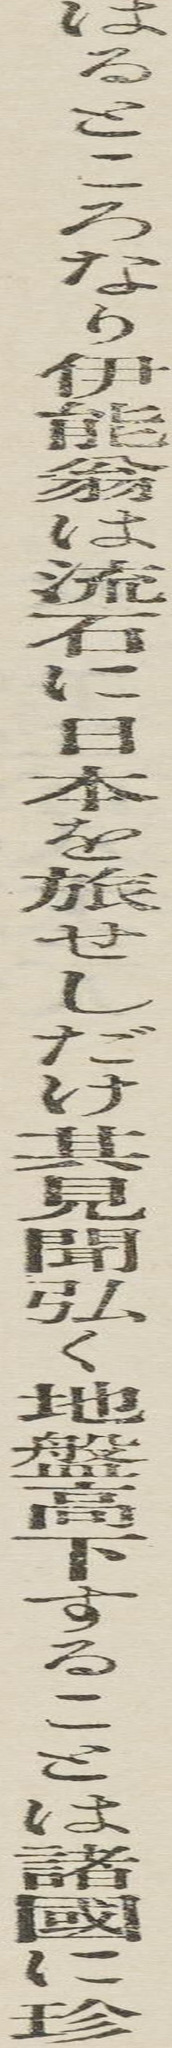はるところなり伊能翁は流石に日本を旅せしだけ其見聞弘く地盤高下することは諸国に珍
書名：土佐古今ノ地震
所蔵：東京大学地震研究所図書室 Earthquake Research Institute Library, The University of Tokyo, JAPAN
